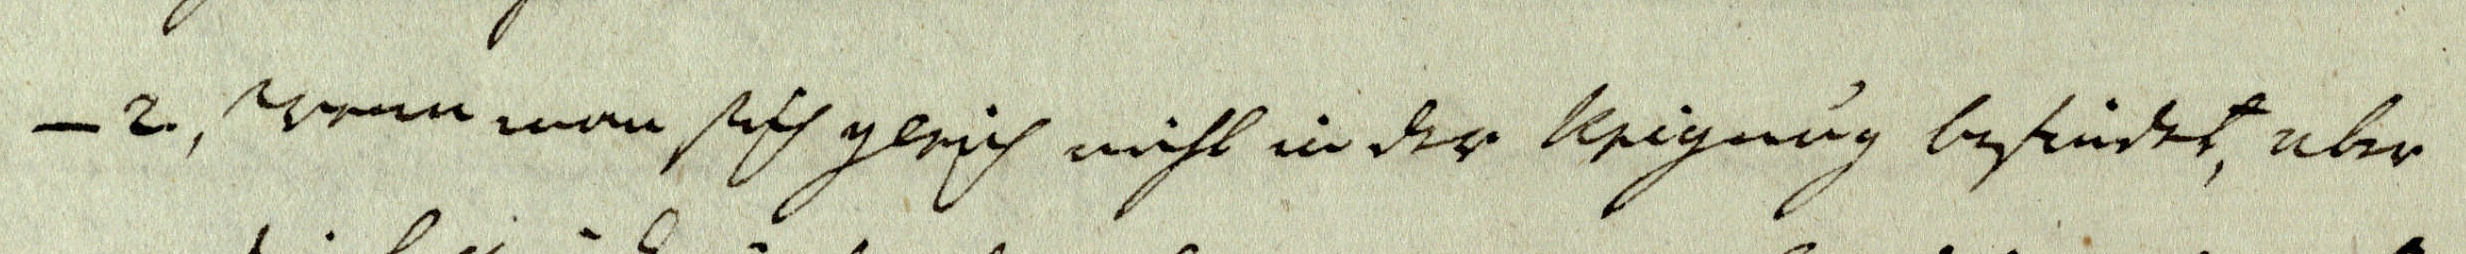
2, Wenn man sich gleich nicht in der Neigung befindet, über
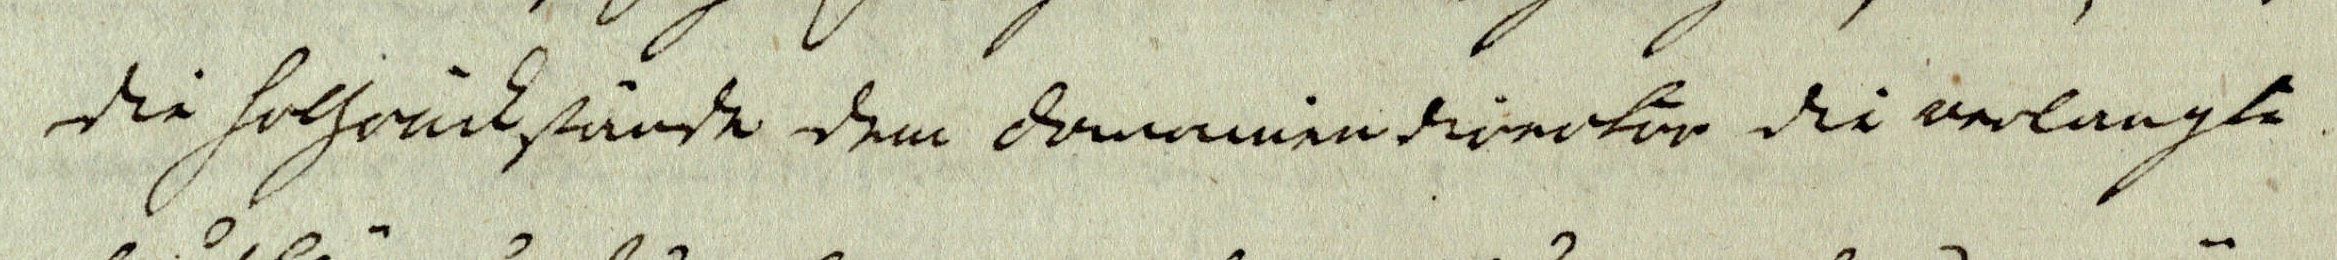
die Holzrückstände dem Domainendirector die verlangte
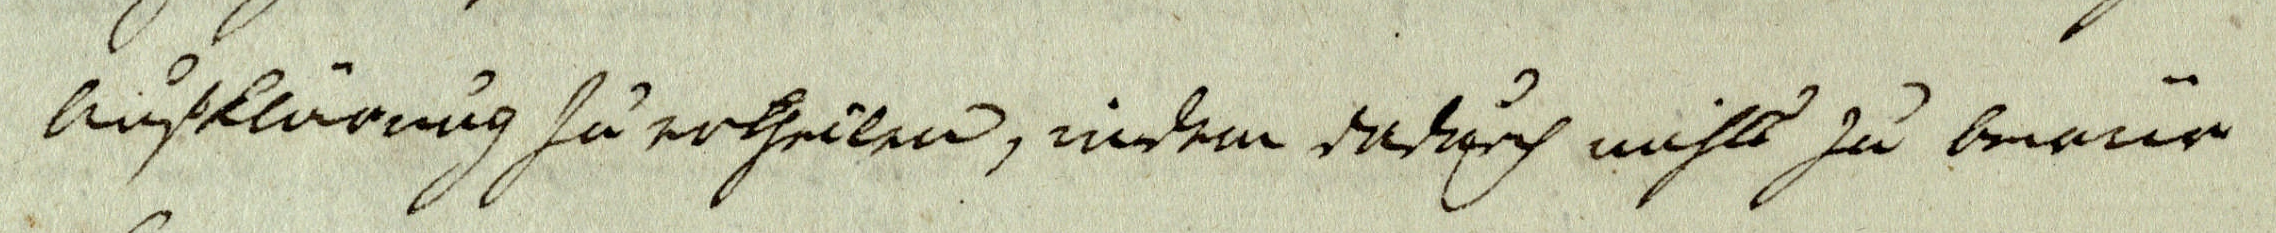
Aufklärung zu ertheilen, indem dadurch nichts zu bewür¬
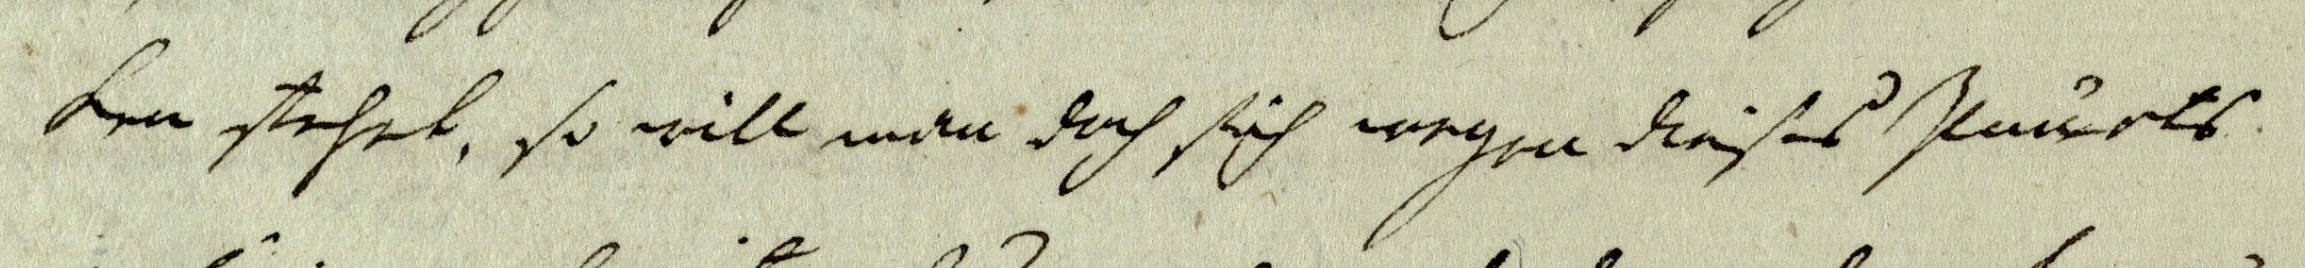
ken stehet, so will man doch sich wegen dieses Puncts
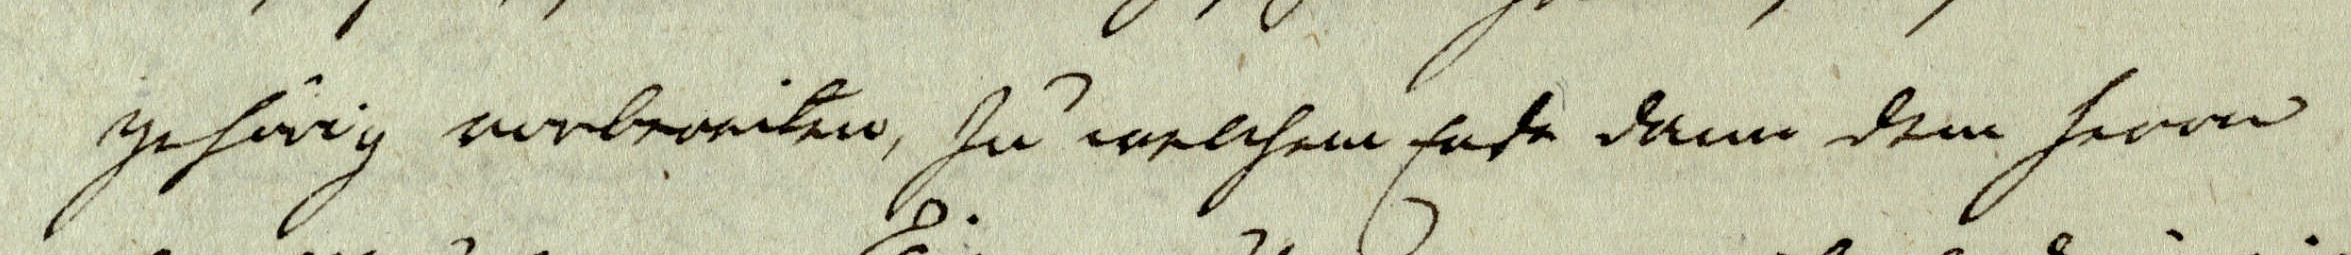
gehörig vorbereiten, zu welchem Ende dann dem Herrn
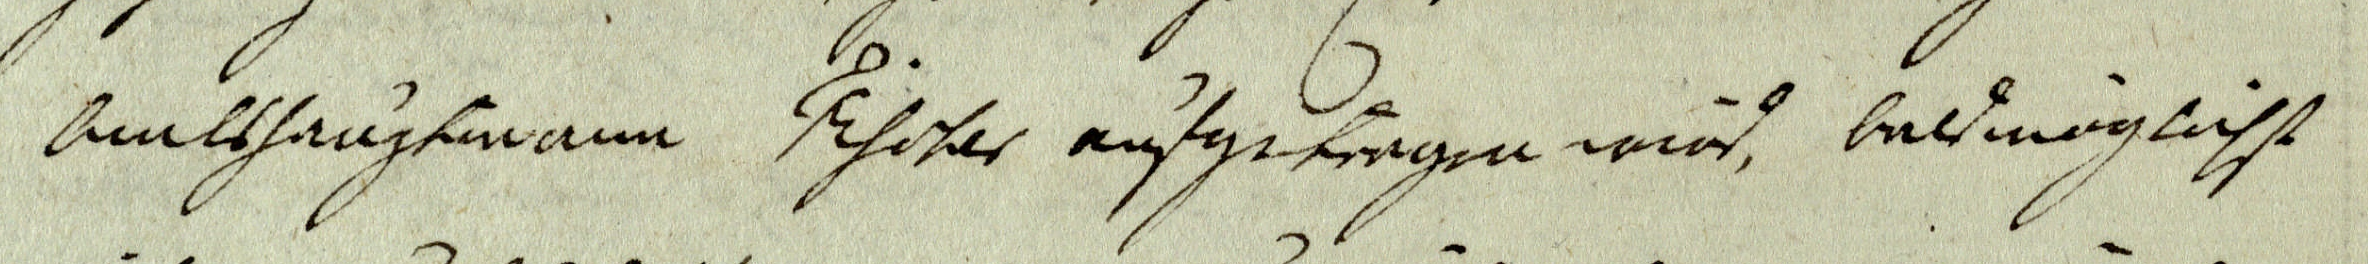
Amtshauptmann Fischer aufgetragen wird, baldmöglichst
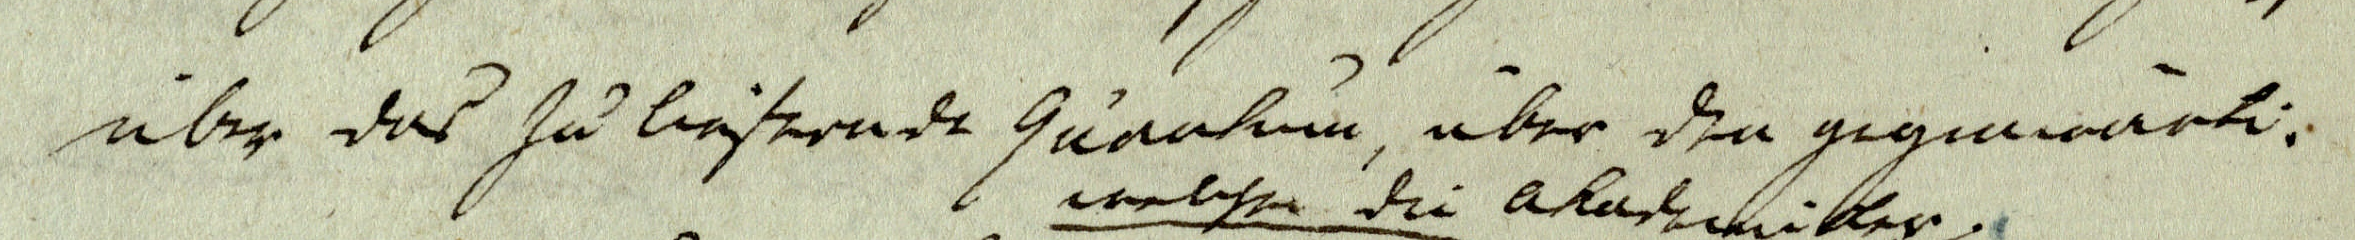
über das zu liefernde Quantum, über den gegenwärti¬
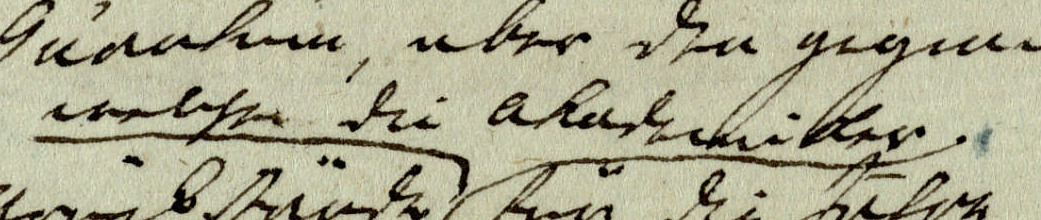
welchen die Akademiker
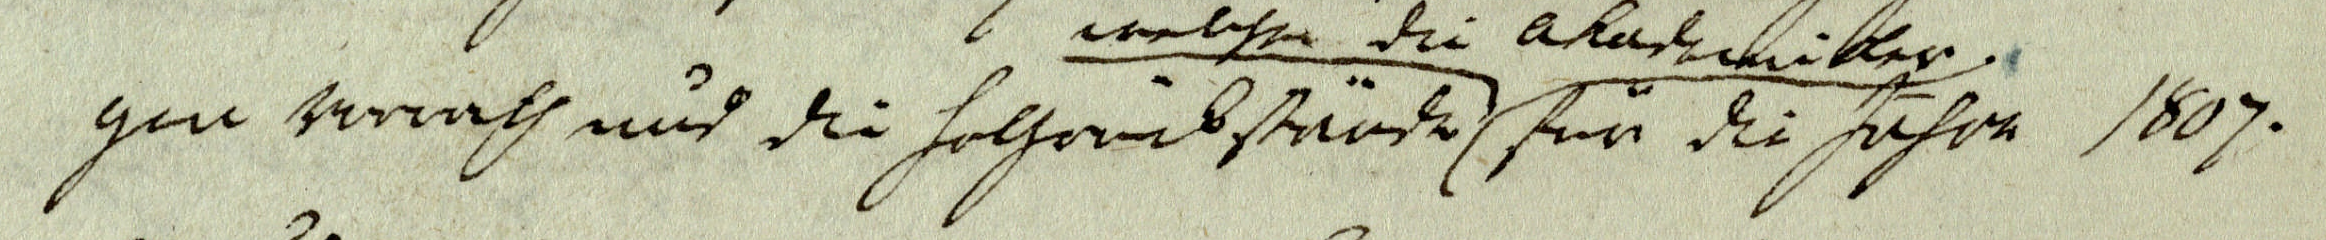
gen Vorrath und die Holzrückstände für die Jahre 1807.
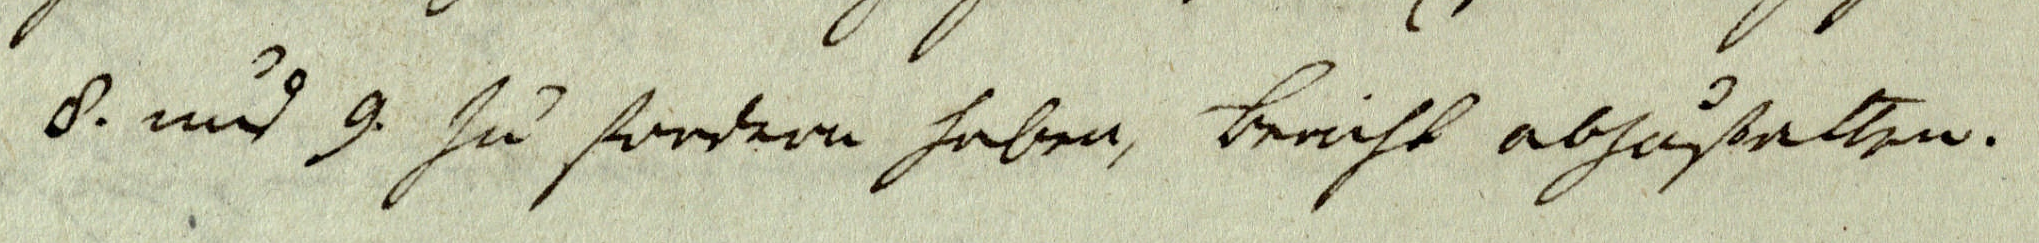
8. und 9 zu fordern haben, Bericht abzustatten.
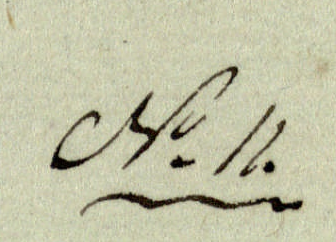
No 11.
